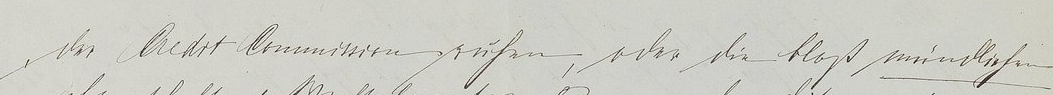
der Credit Commission ruhen, oder die bloß mündlichen
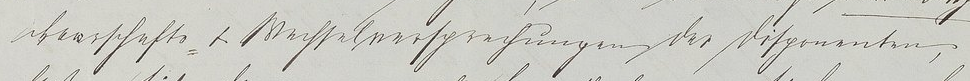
Baarschafts- & Wechselversprechungen der Disponenten,
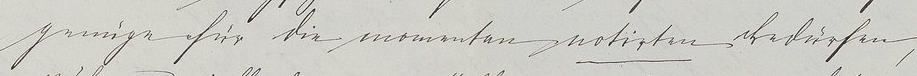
genüge für die momentan notirten Bedürfen,
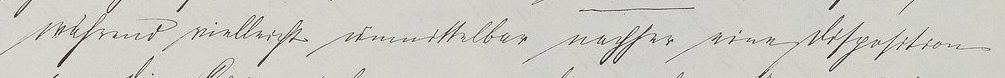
während vielleicht unmittelbar nachher eine Disposition
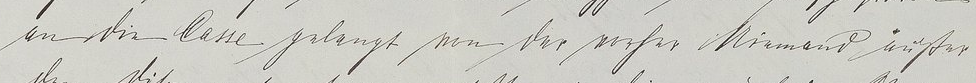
an die Casse gelangt von der vorher Niemand außer
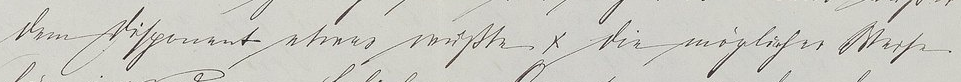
dem Disponent etwas wüßte & die möglicher Weise
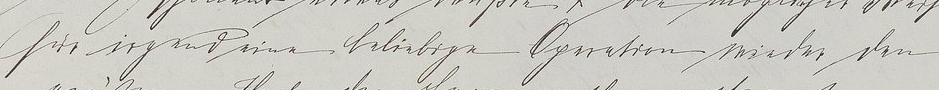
für irgend eine beliebige Operation wieder den
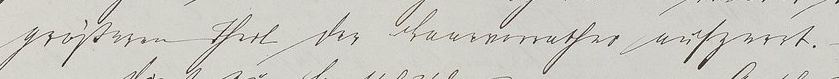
größeren Theil des Baarvorrathes aufzerrt. –
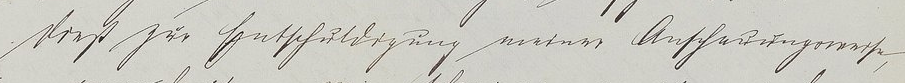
Dieß zur Entschuldigung meiner Anschauungsweise,
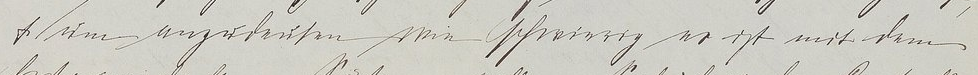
& um anzudeuten wie schwierig es ist mit dem
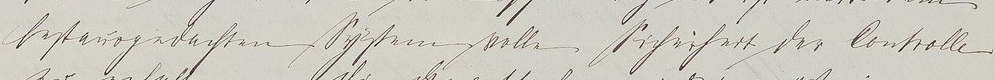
festausgedachten System volle Sicherheit der Controlle
